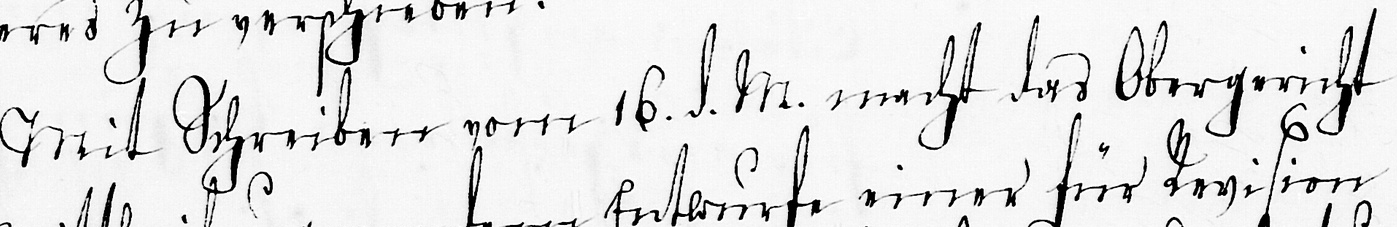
Mit Schreiben vom 16. d. M. macht das Obergericht
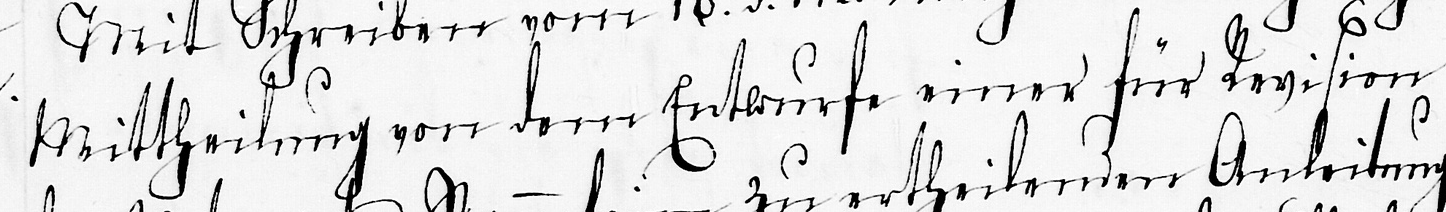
Mittheilung von dem Entwurfe einer für Revision
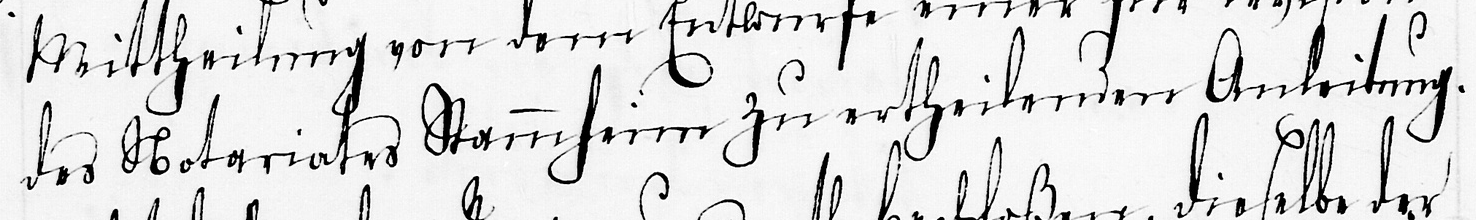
des Notariates Stammheim zu ertheilenden Anleitung.
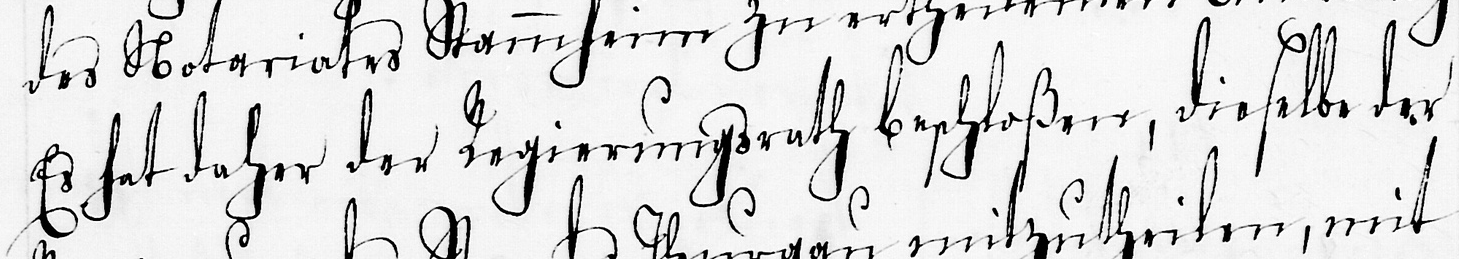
Es hat daher der Regierungsrath beschloßen, dieselbe
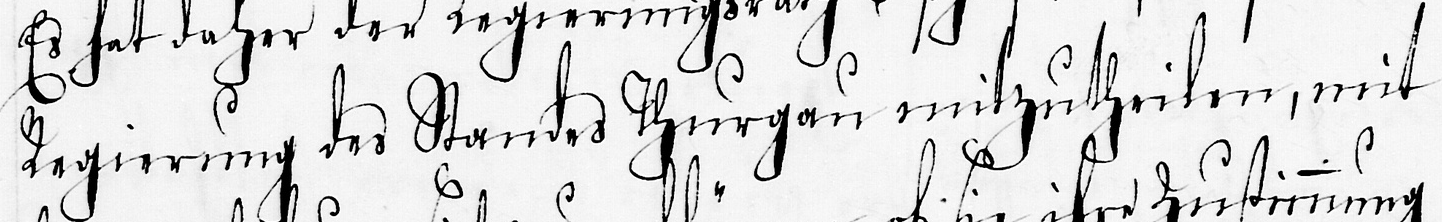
Regierung des Standes Thurgau mitzutheilen, mit
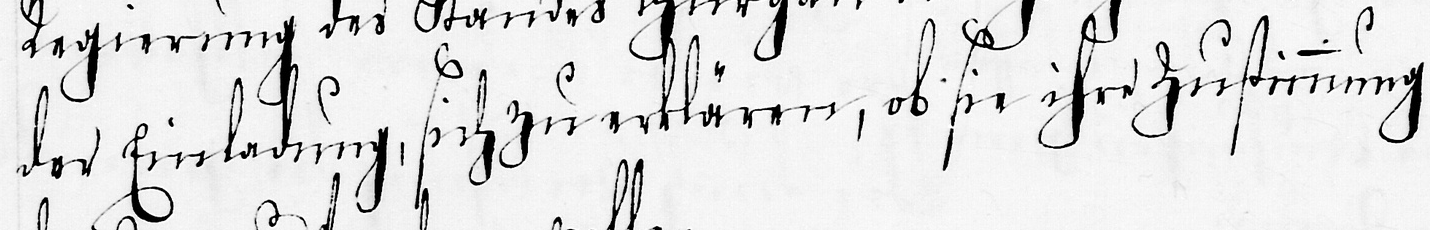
der Einladung, sich zu erklären, ob sie ihre Zustimmung
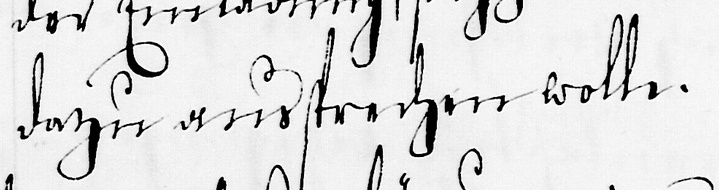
dazu aussprechen wolle.
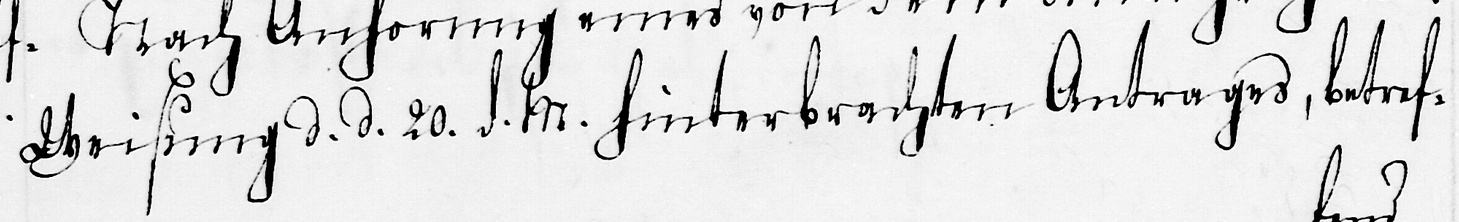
Weisung d. d. 20. d. M. hinterbrachten Antrages, betref-
